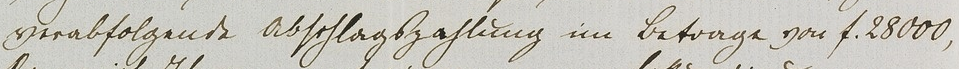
vorabfolgende Abschlagszahlung im Betrage von f. 28000,
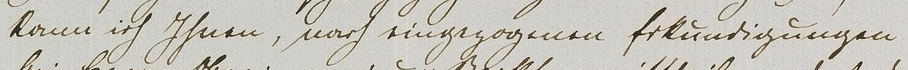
kann ich Ihnen, nach eingezogenen Erkundigungen
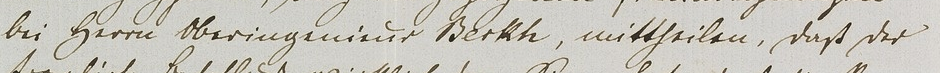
bei Herrn Oberingenieur Beckh, mittheilen, daß der
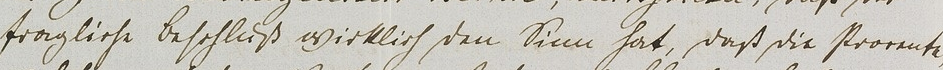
fragliche Beschluß wirklich den Sinn hat, daß die Procente,
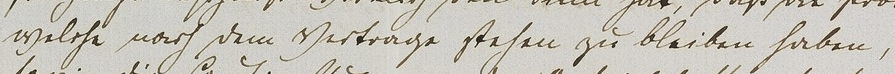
welche nach dem Vertrage stehen zu bleiben haben,
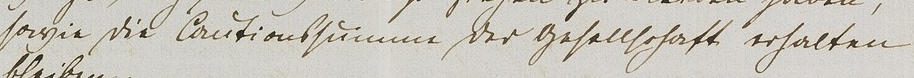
sowie die Cautionssumme der Gesellschaft erhalten
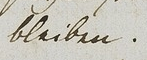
bleiben.
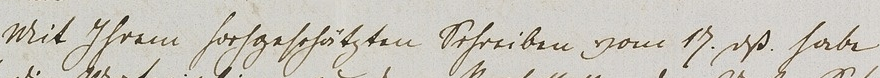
Mit Ihrem hochgeschätzten Schreiben vom 17. dß. habe
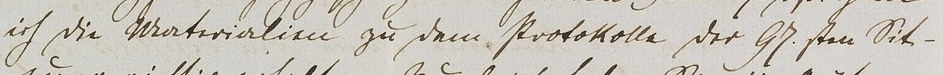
ich die Materialien zu dem Protokolle der 97.sten Sit-
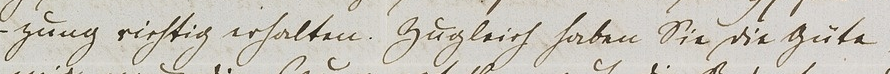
zung richtig erhalten. Zugleich haben Sie die Güte,
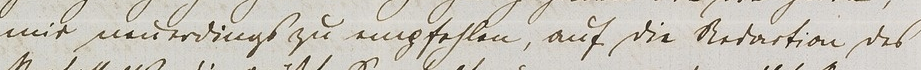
mir neuerdings zu empfehlen, auf die Redaction des
